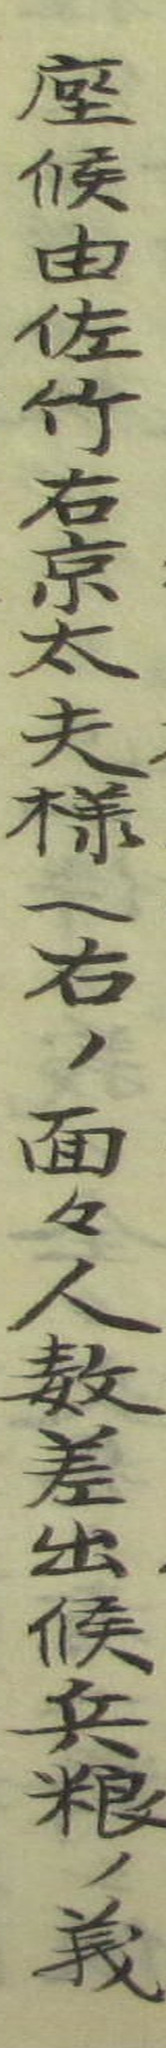座候由佐竹右京太夫様ヘ右ノ面々人數差出候兵粮ノ義
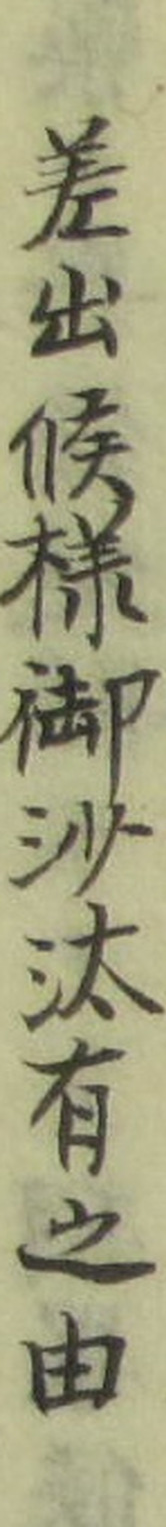差出候様御沙汰有之由
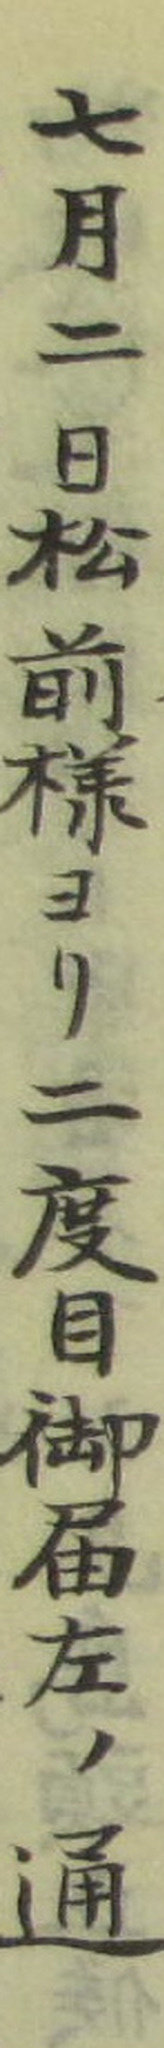七月二日松前様ヨリ二度目御届左ノ通
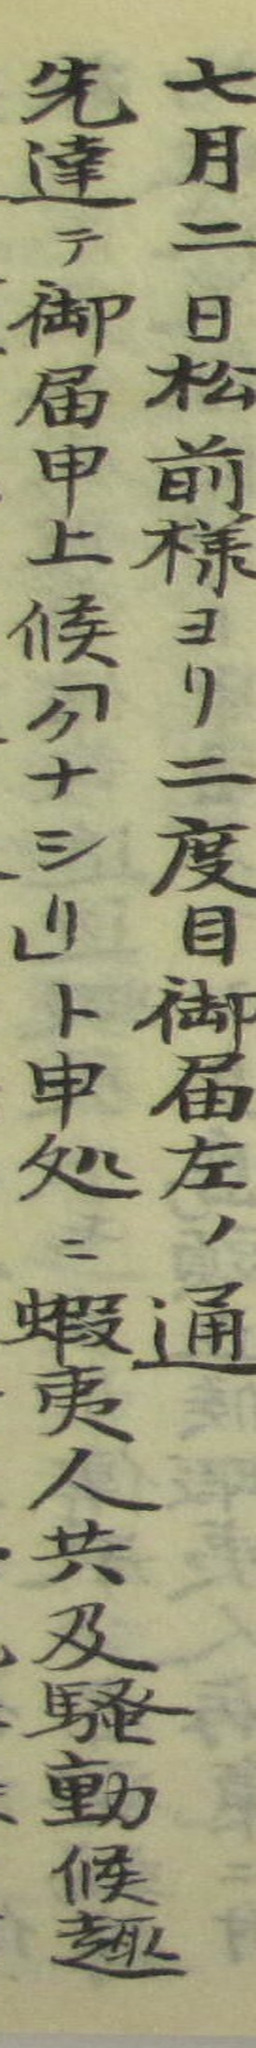先達テ御届申上候「クナシリ」ト申処ニ蝦夷人共及騒動候趣
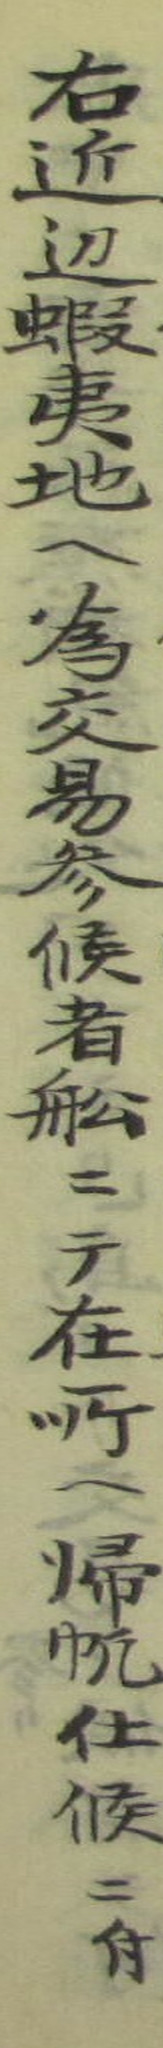右近辺蝦夷地ヘ為交易参候者舩ニテ在所ヘ帰帆仕候ニ付

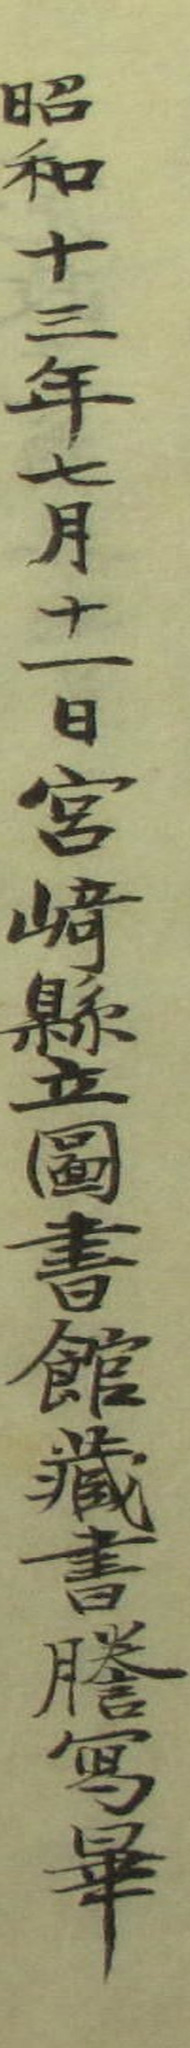昭和十三年七月十一日宮崎縣立図書館蔵書謄寫畢
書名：異国船漂着記 外二
